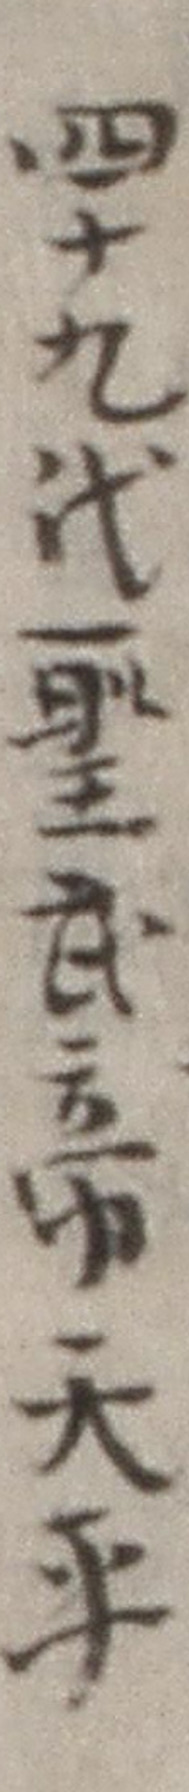四十九代聖武帝天平
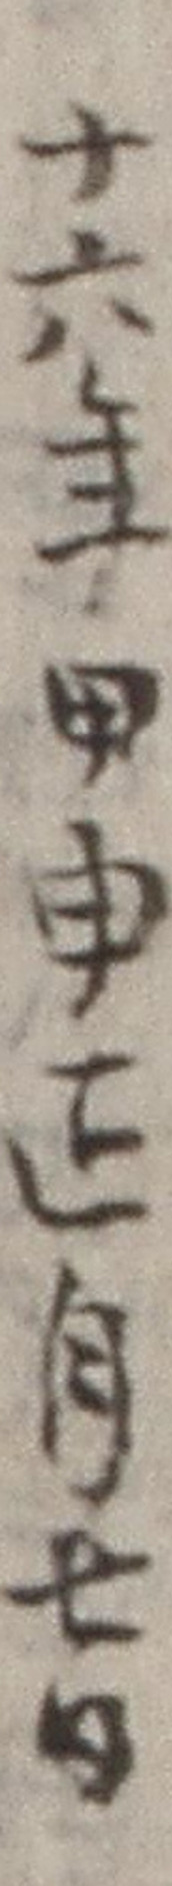十六年甲申正月七日
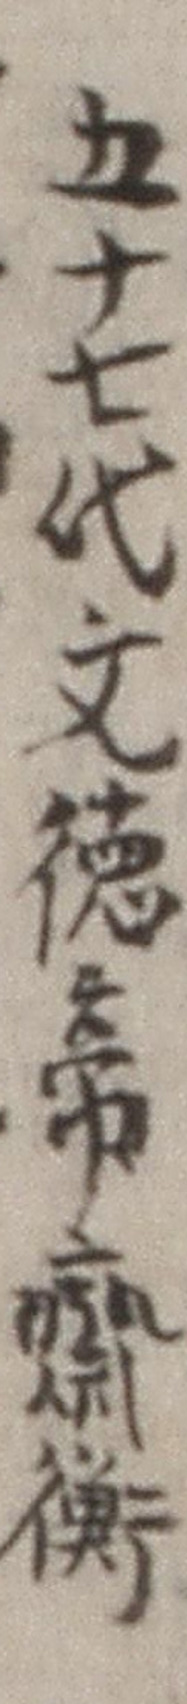五十七代文徳帝齋衡
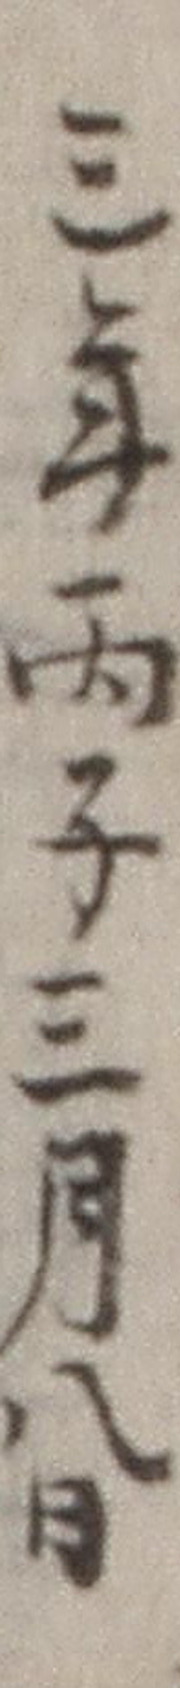三年丙子三月八日
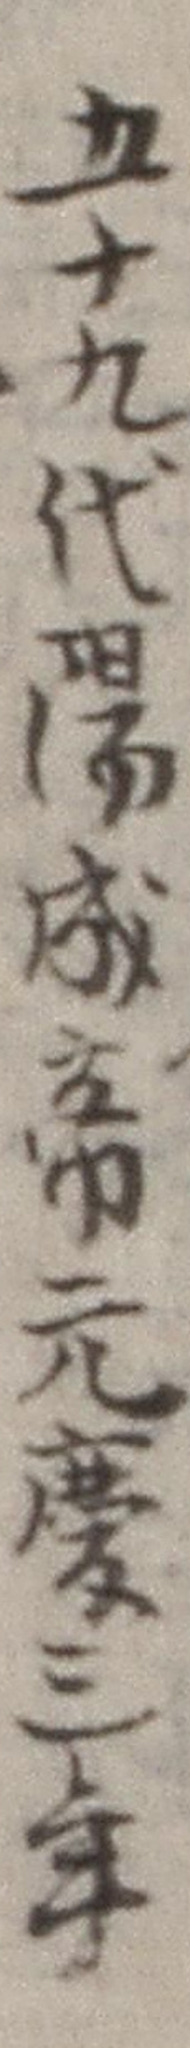五十九代陽成帝元慶三年
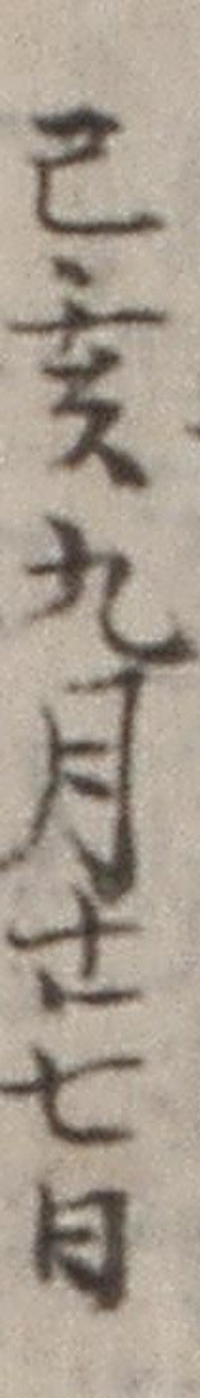己亥九月廿七日
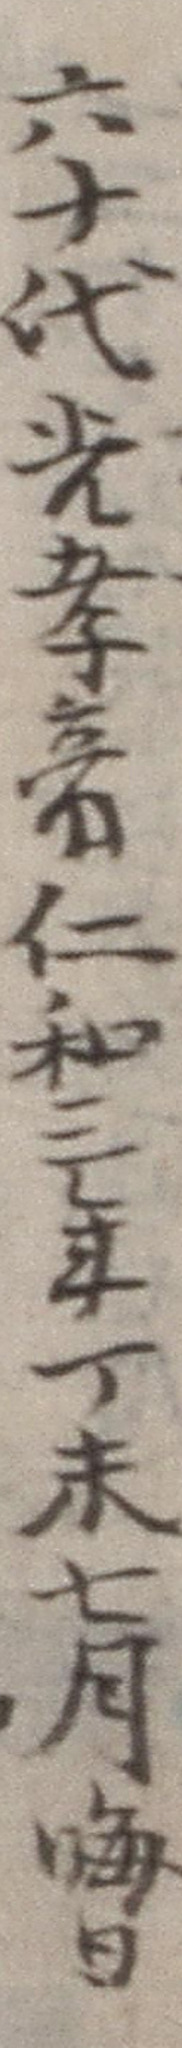六十代光孝帝仁和三年丁未七月晦日
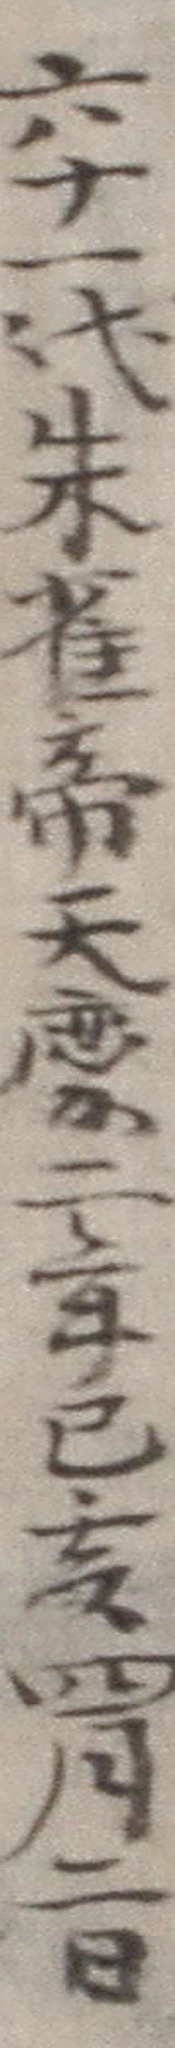六十一代朱雀帝天慶二年巳亥四月二日
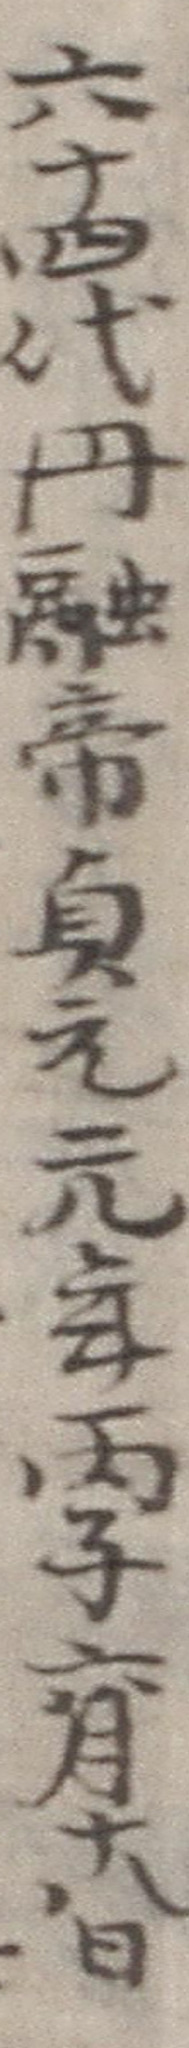六十四代円融帝貞元元年丙子六月十八日
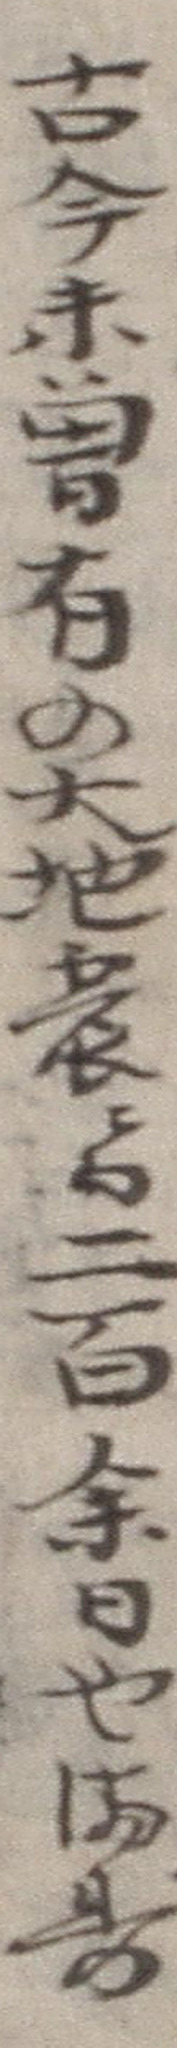古今未曾有の大地震ニ而二百余日やまず
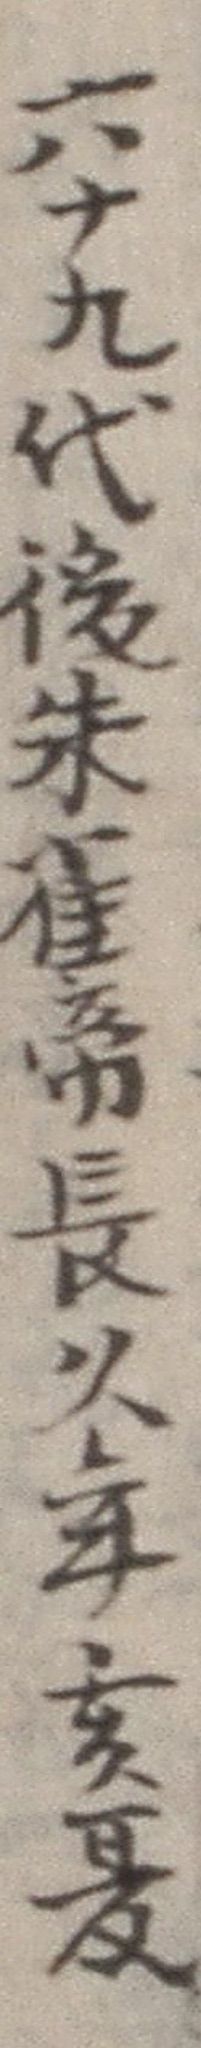六十九代後朱雀帝長久年亥夏
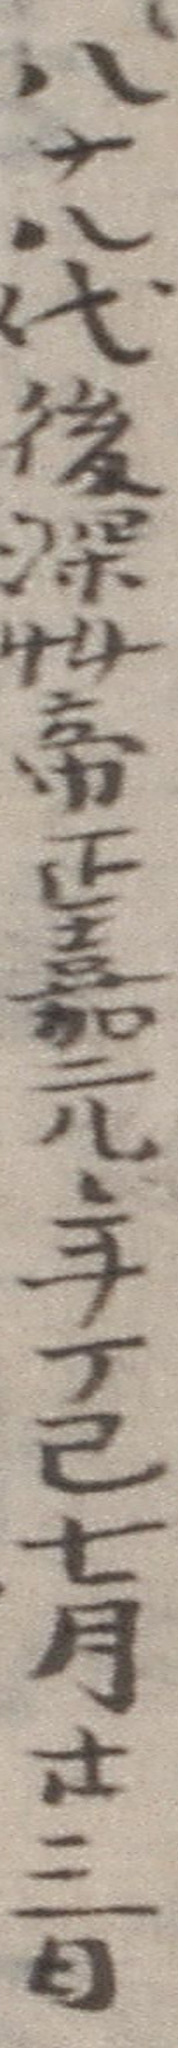八十八代後深艸帝正嘉元年丁己七月廿三日
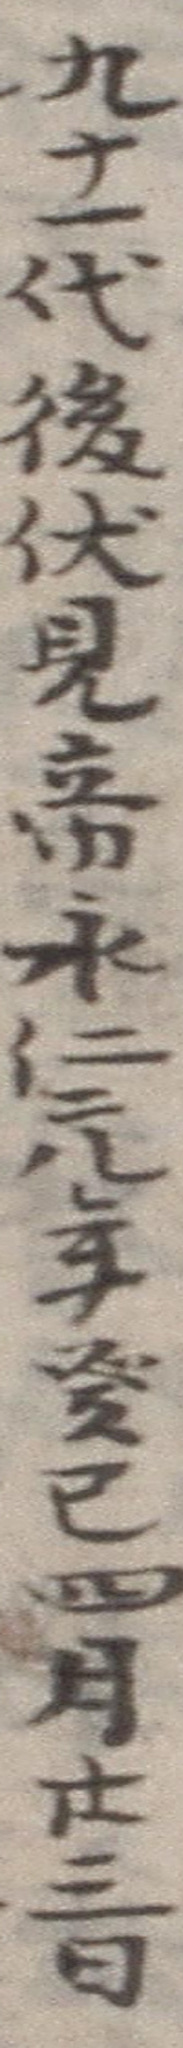九十一代後伏見帝永仁元年癸巳四月廿三日
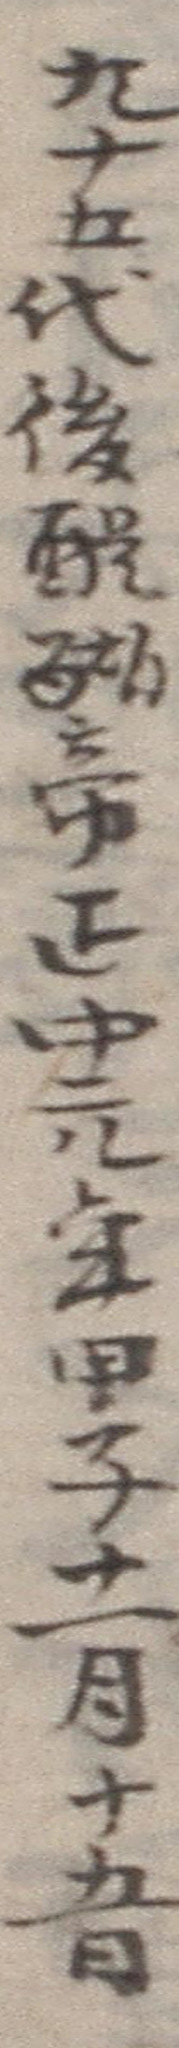九十五代後醍醐帝正中元年甲子十一月十五日
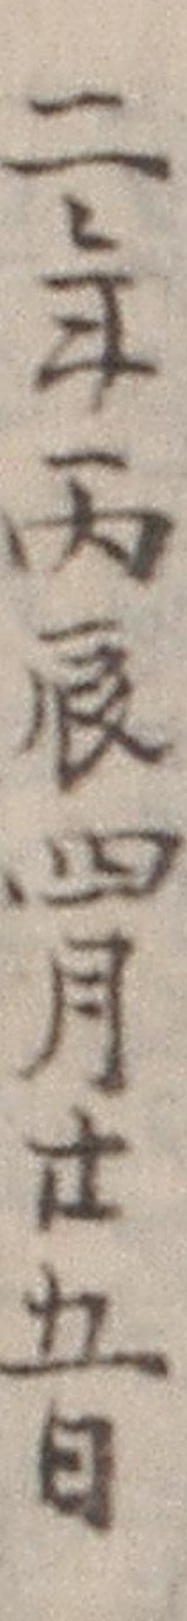二年丙辰四月二十五日
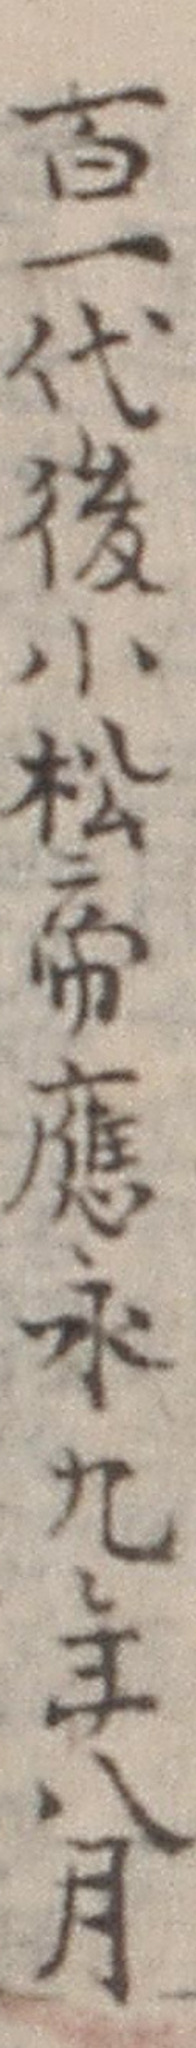百一代後小松帝應永九年八月
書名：諸國大地震年代記末代噺種
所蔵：東京大学地震研究所図書室 Earthquake Research Institute Library, The University of Tokyo, JAPAN
